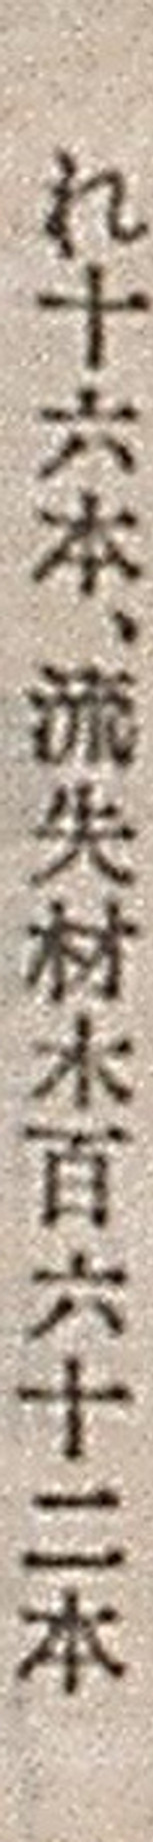れ十六本、流失材木百六十二本
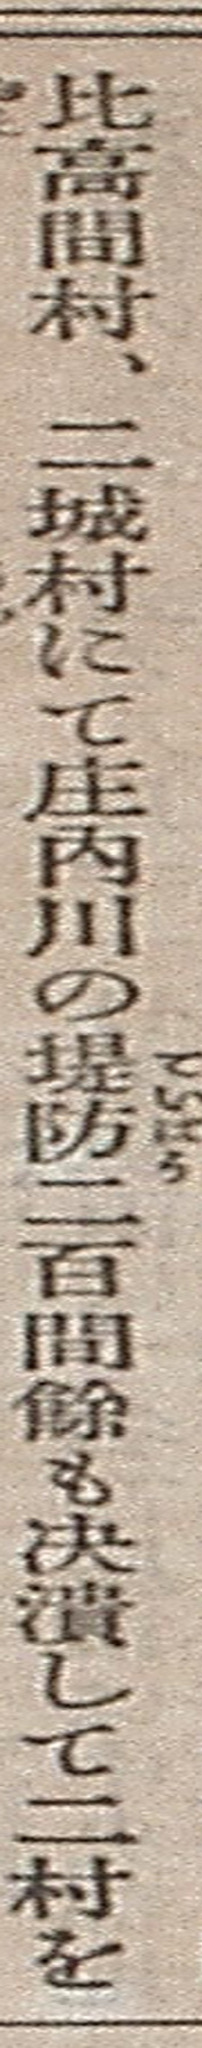比高間村、二城村にて庄内川の堤防二百間餘も欠潰して二村を
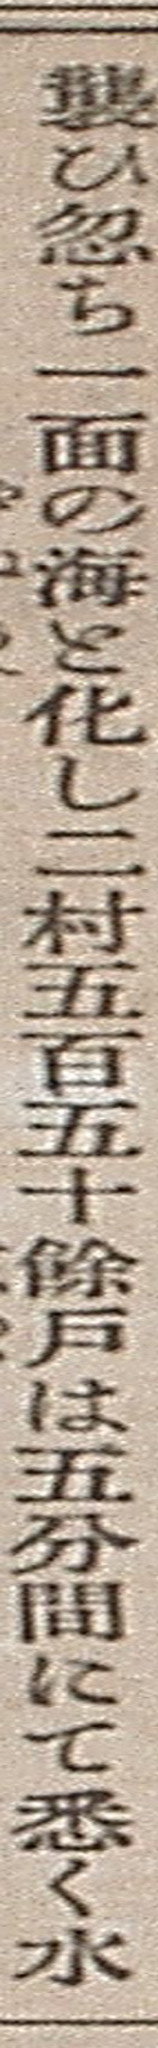襲ひ忽ち一面の海と化し二村五百五十餘戸は五分間にて悉く水
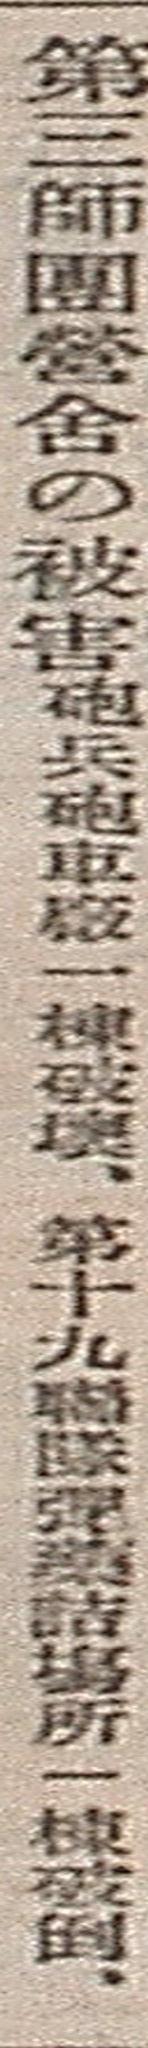第三師団営舎の被害砲兵砲車廠一棟破壊、第十九聯隊弾薬詰場所一棟破倒、
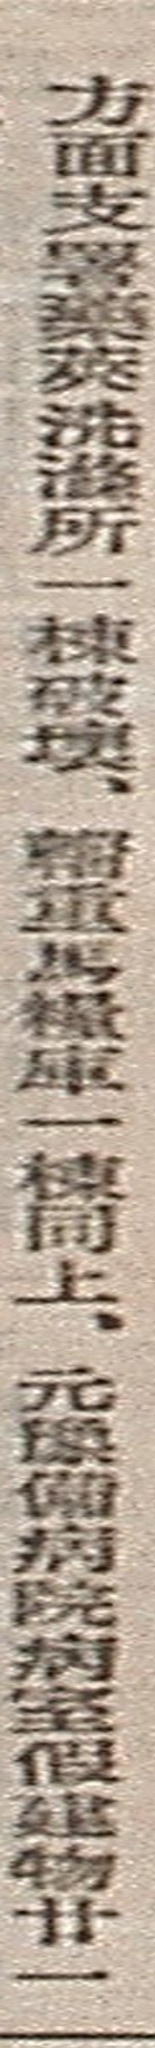方面支署薬莢洗浄所一棟破壊、輜重馬糧庫一棟同上、元予備病院病室仮建物廿一
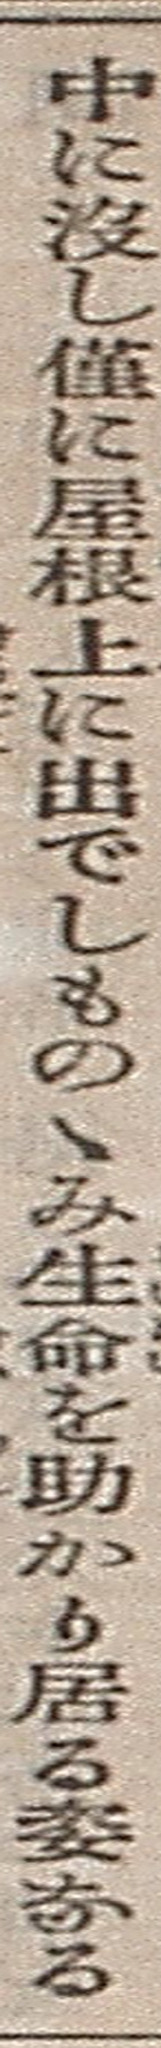中に没し僅に屋根上に出でしものゝ生命を助かり居る姿なる
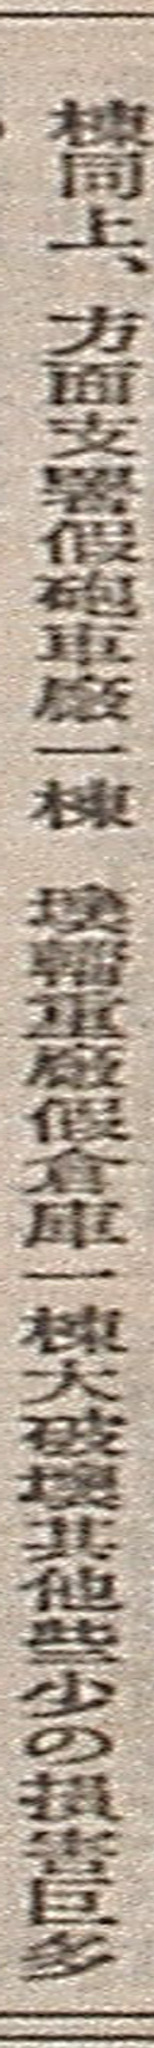棟同上、方面支署仮砲車廠一棟壊輜重廠仮倉庫一棟大破壊其他些少の損害巨多
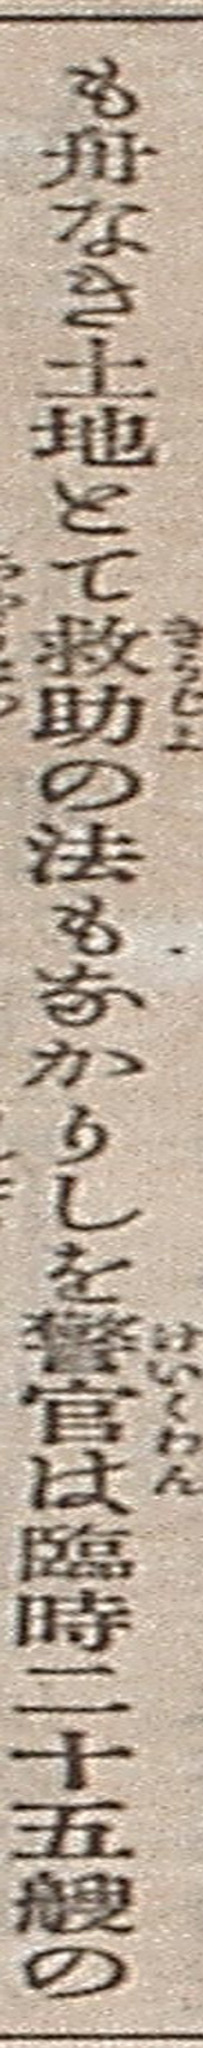も舟なき土地とて救助の法もなかりしを警官は臨時二十五艘の
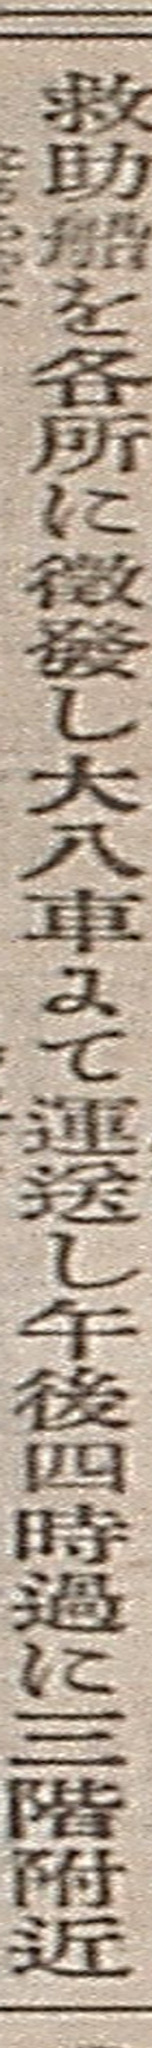救助船を各所に徴発し大八車にて運送し午後四時過に三階附近
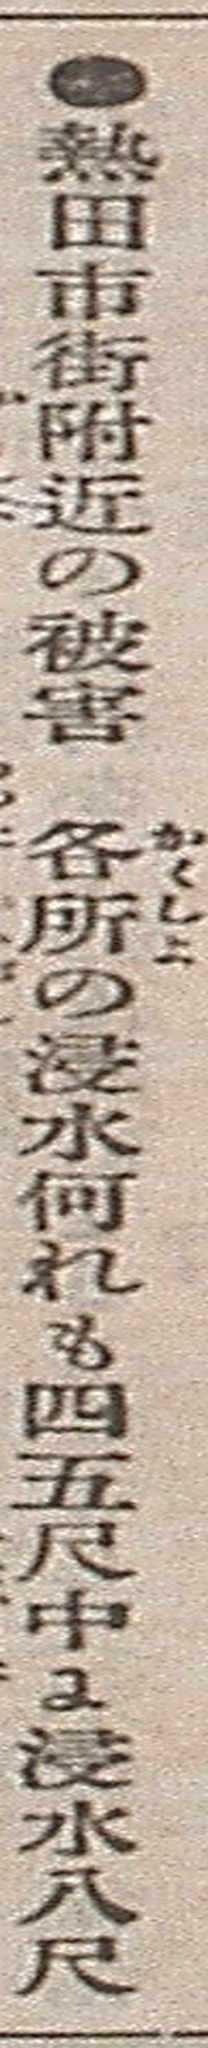●熱田市街附近の被害各所の浸水何れも四五尺中に浸水八尺
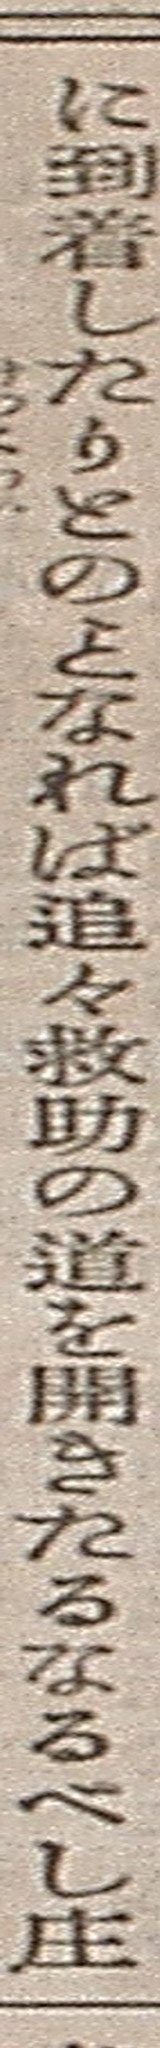に到着したりとのことなれば追々救助の道を開きたるなるべし庄
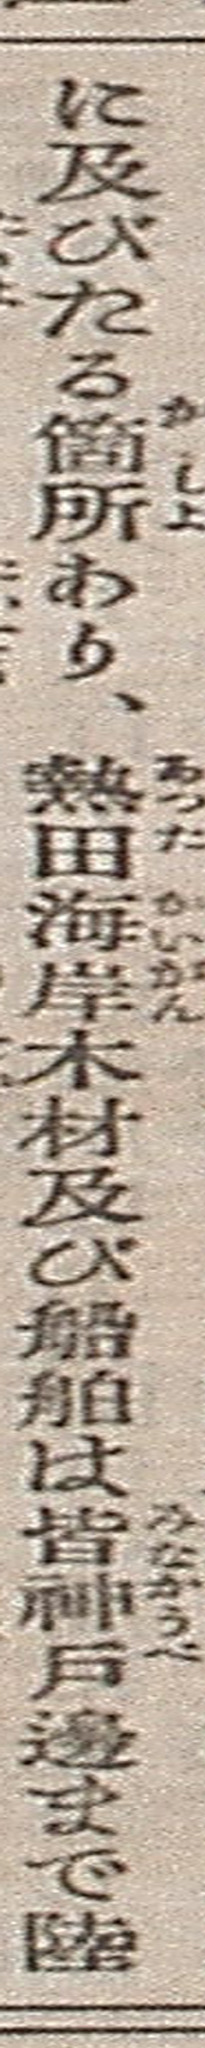に及びたる箇所あり、熱田海岸木材及び船舶は皆神戸辺まで陸
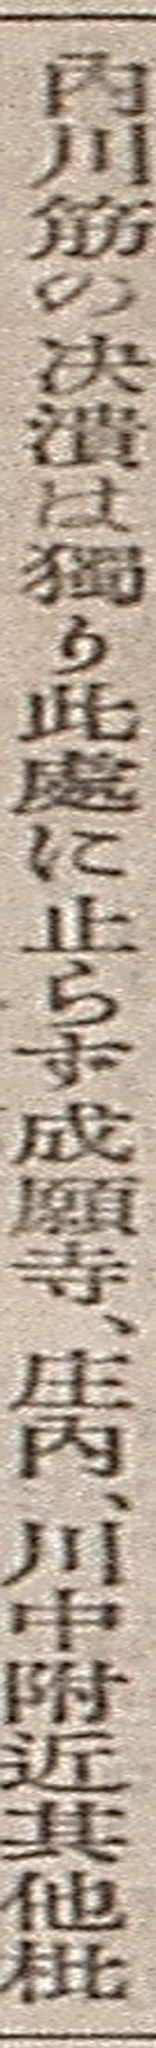内川筋の决潰は独り此処に止らず成願寺、庄内、川中附近其他枇
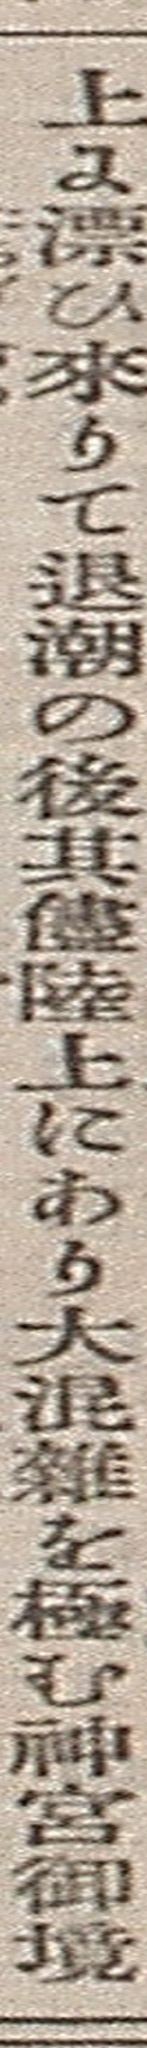上に漂ひ来りて退潮の後其儘陸上にあり大混雑を極む神宮御境
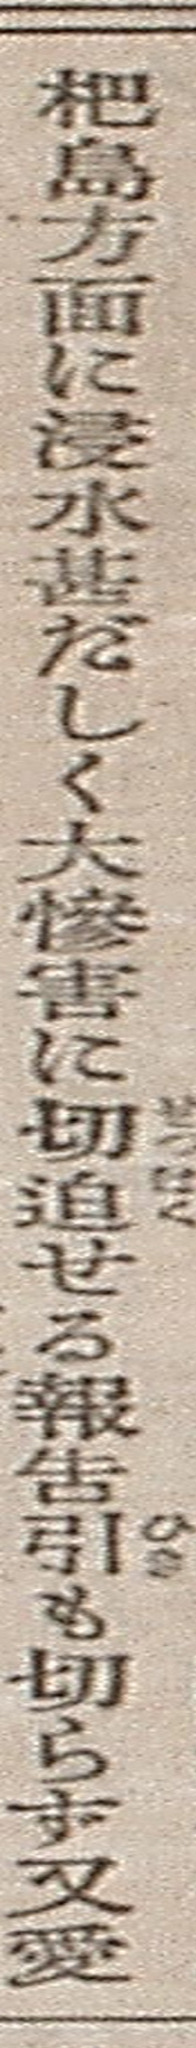杷島方面に浸水甚だしく大惨害に切迫せる報告引も切らず又愛
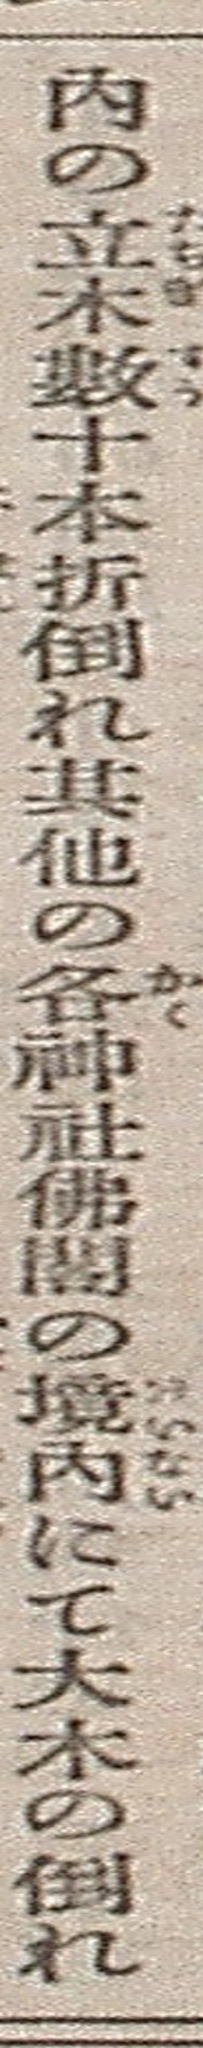内の立木数十本折倒れ其他の各神社仏閣の境内にて大木の倒れ
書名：風俗畫報臨時増刊第百二十六號　洪水被害録（中）
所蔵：東京大学地震研究所図書室 Earthquake Research Institute Library, The University of Tokyo, JAPAN
